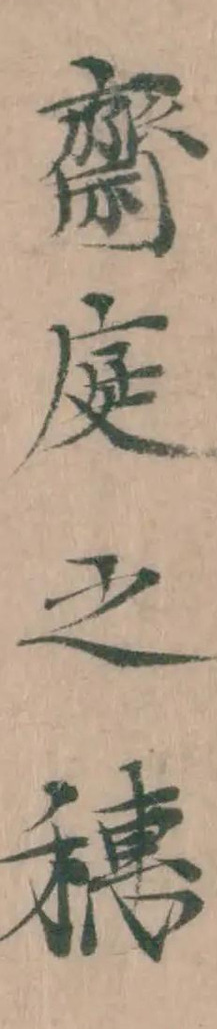斎庭之穂
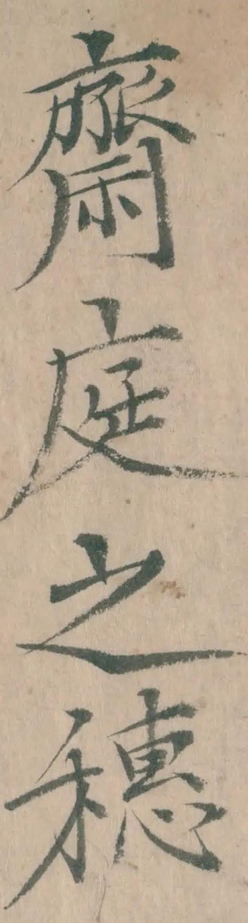斎庭之穂

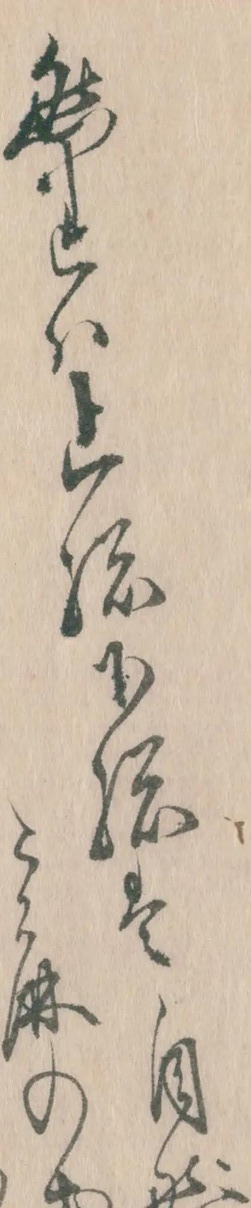然れは上総下総は自然
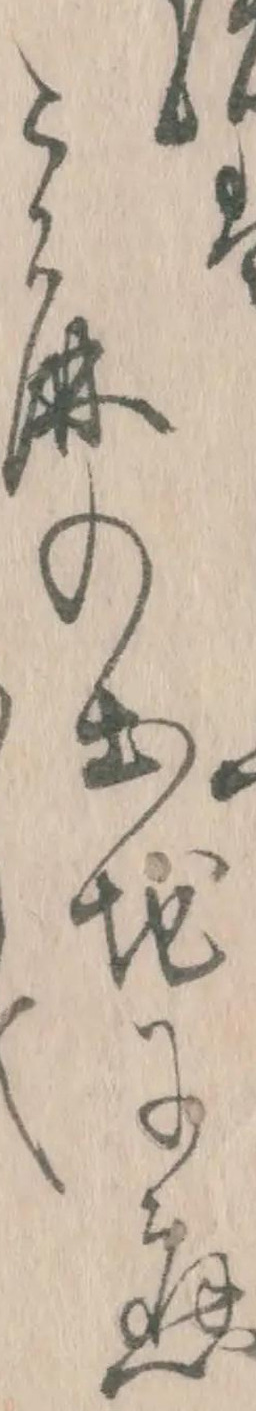と麻の土地に応
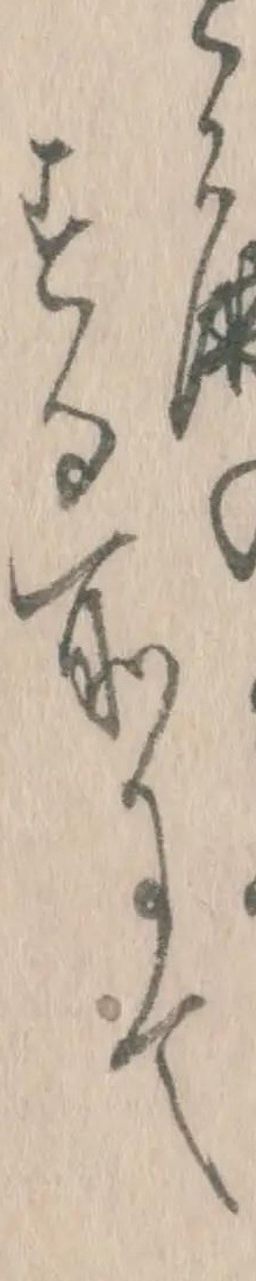する所にて

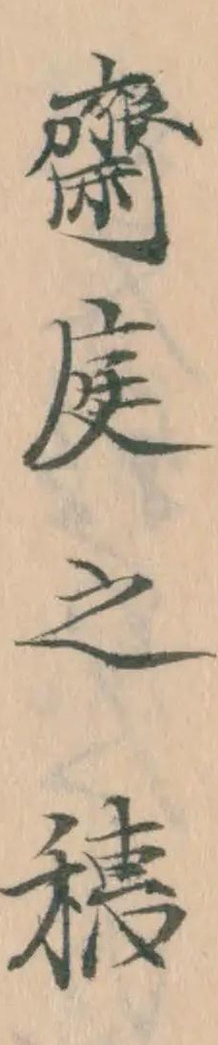斎庭之穂
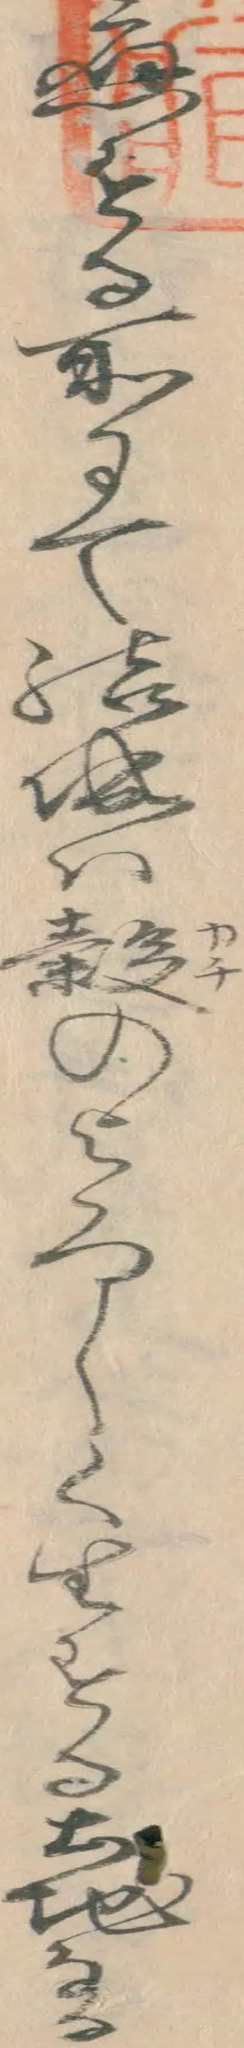応する所にて結城は穀のよろしく生する土地なる
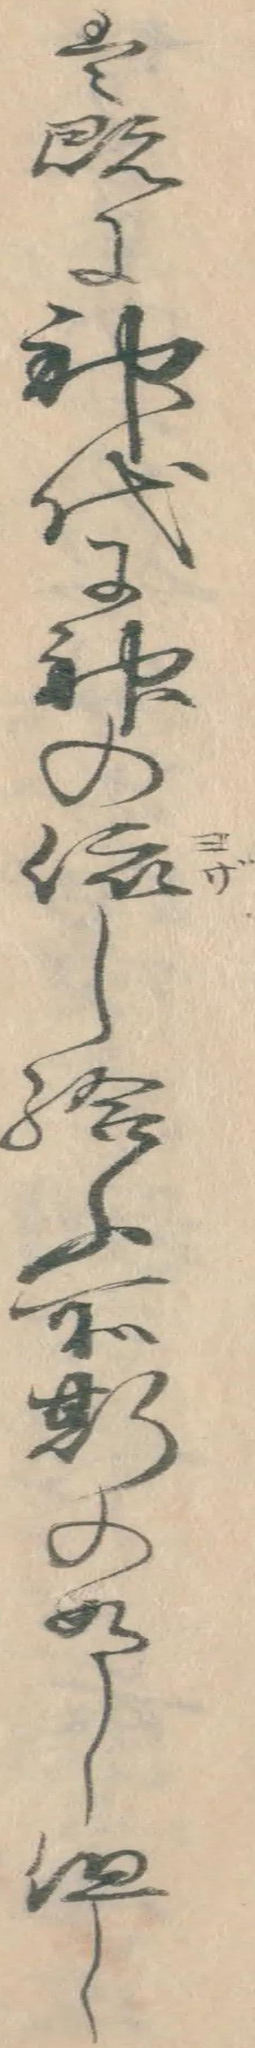は既に神代に神の依し給ふ所斯の如し但し
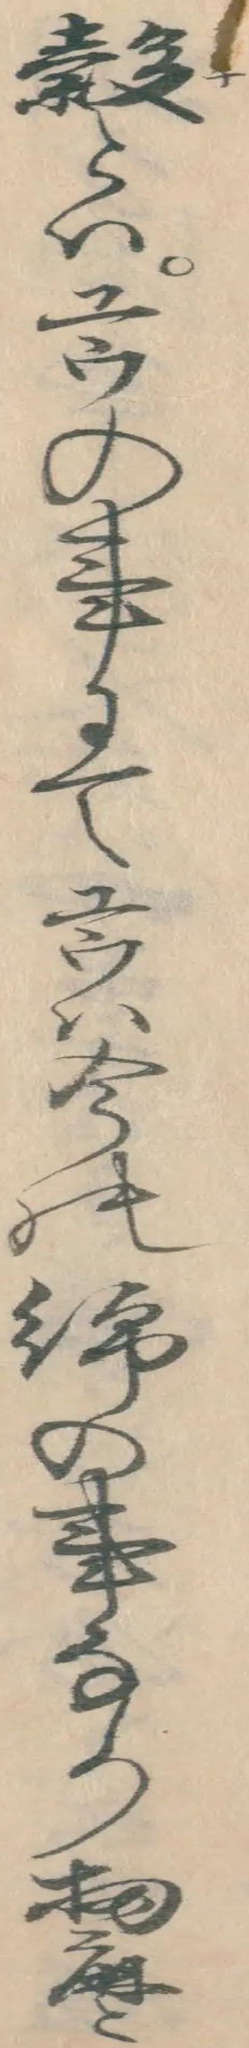穀とは。ユウの事にてユウは今の綿の事なり扨麻と
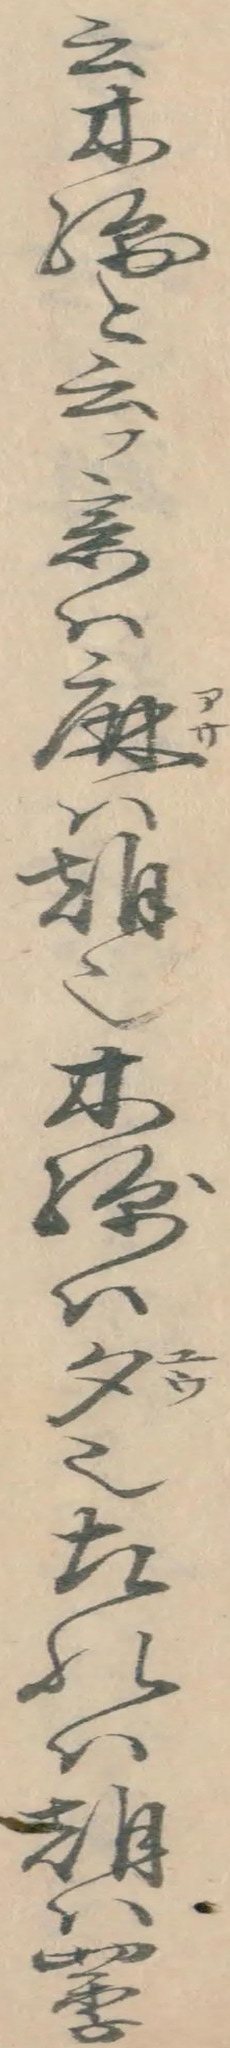云木綿と云ふ意は麻は朝也木綿は夕也左れは朝は四季

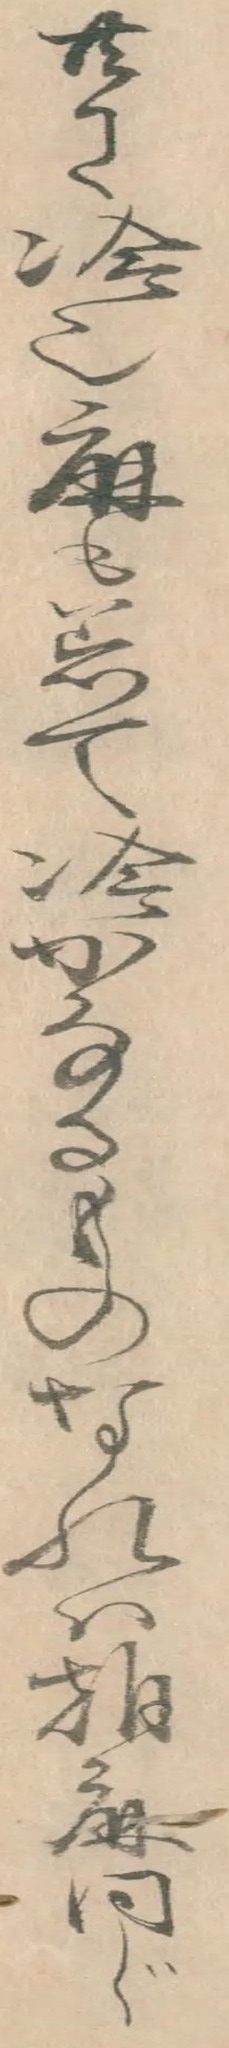共に冷也麻も着て冷かなるものなれは朝麻同じ
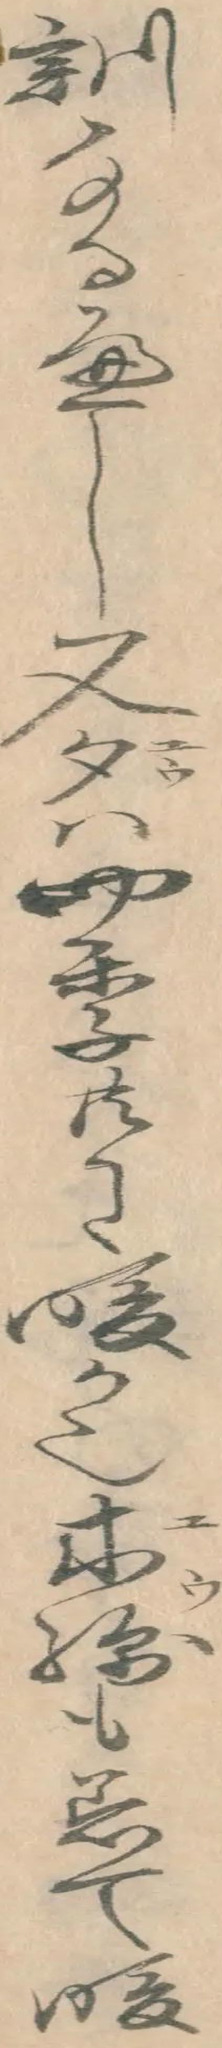訓なるへし又夕は四季共に暖か也木綿も着て暖
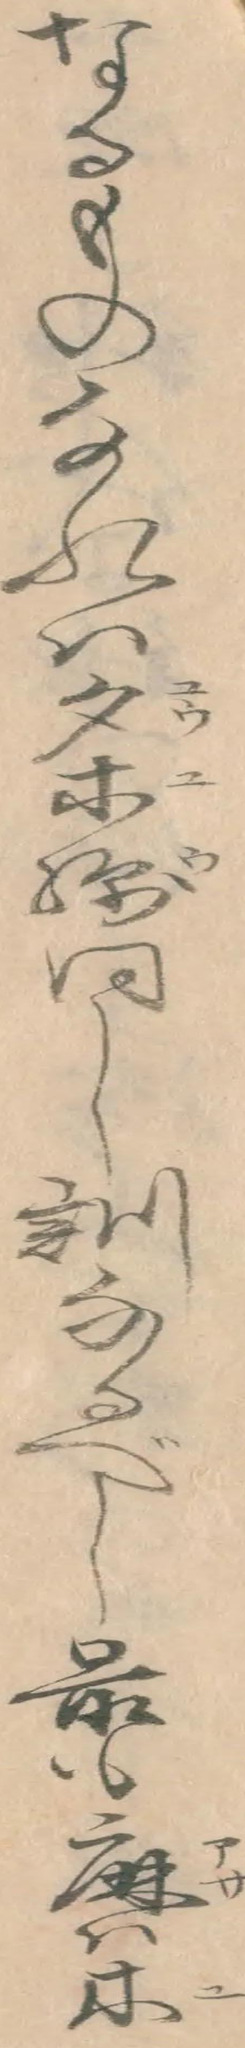なるものなれは夕木綿同し訓なるべし最も麻は木
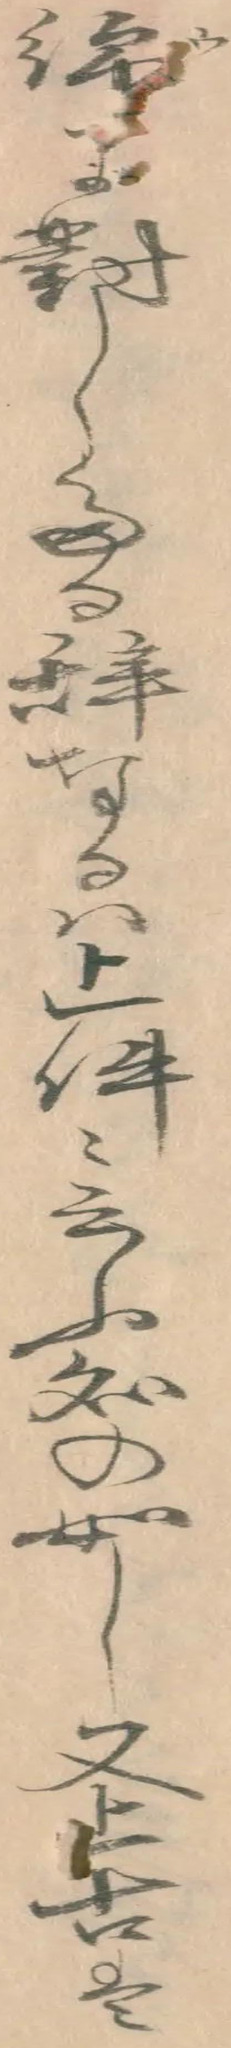綿に対したる辞なるは上件に云ふ処の如し又上古は
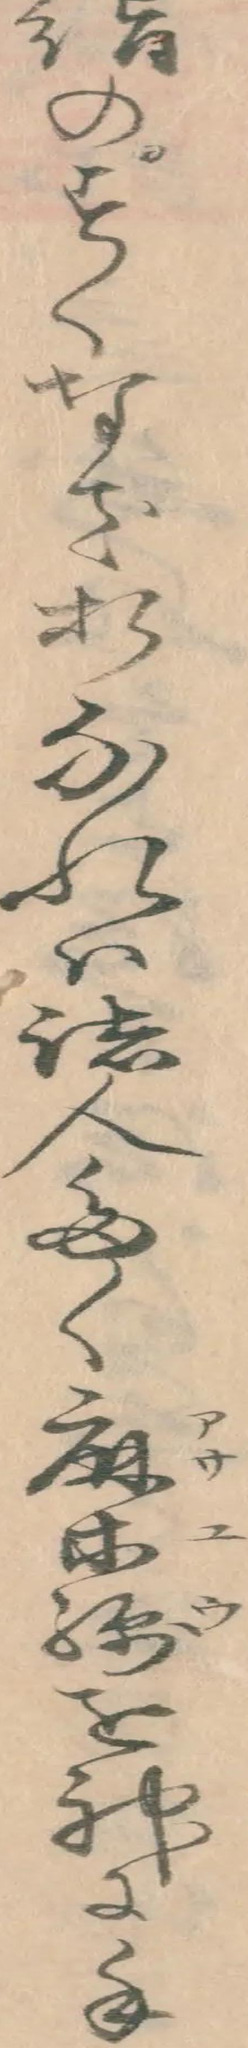絹の。すくなき折なれは諸人多く麻木綿を神に手
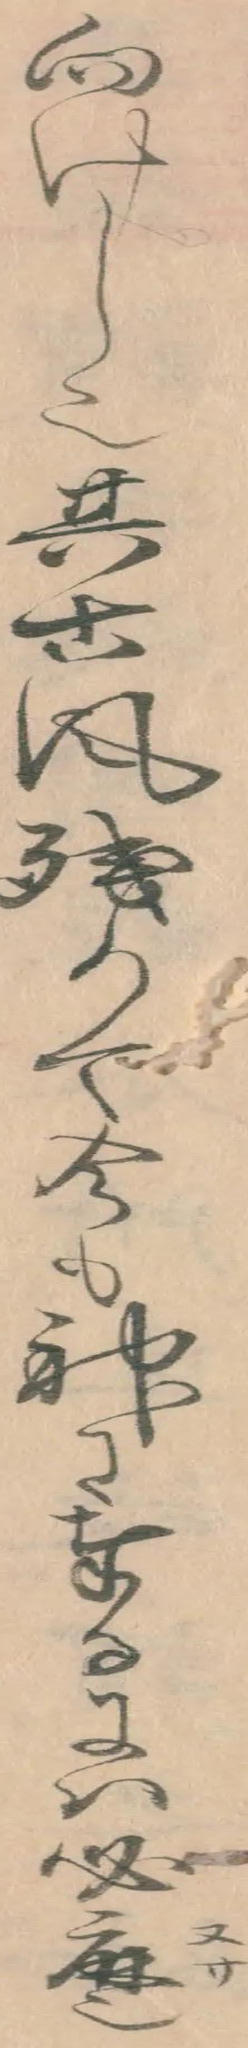向けし也其古風残りて今も神に奉るには必麻也
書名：斎庭之穂
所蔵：国立国会図書館 National Diet Library, JAPAN
